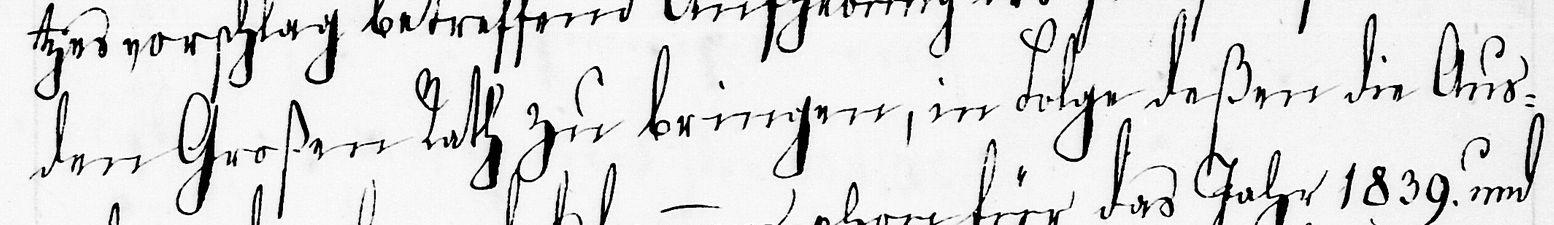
den Großen Rath zu bringen, in Folge deßen die Aus¬
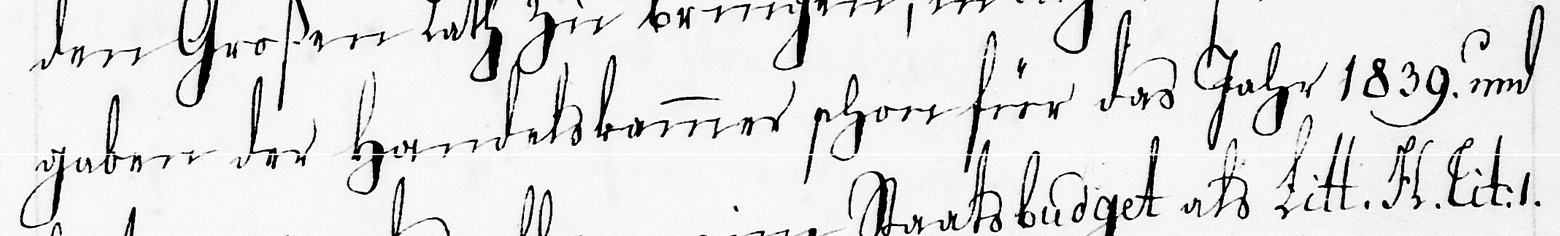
gaben der Handelskammer schon für das Jahr 1839. und
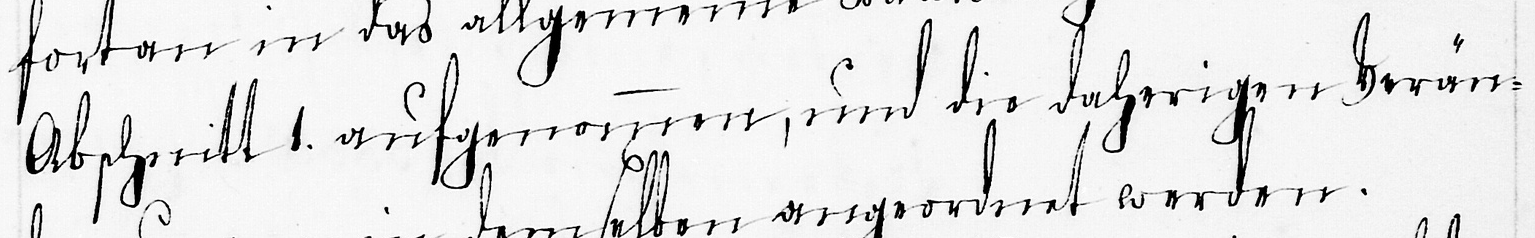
Abschnitt 1. aufgenommen, und die daherigen Verän¬
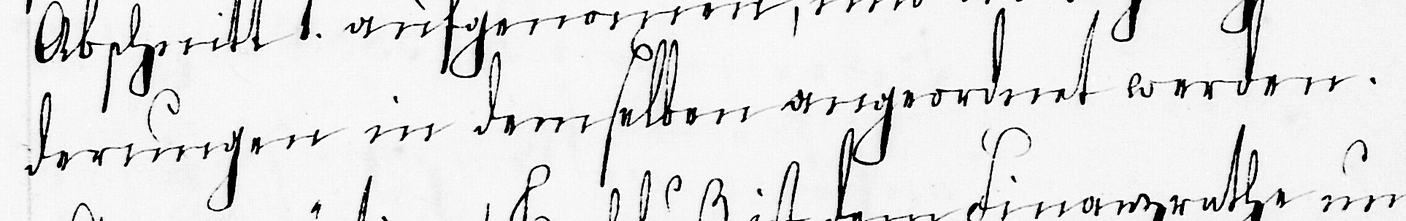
derungen in demselben angeordnet werden.
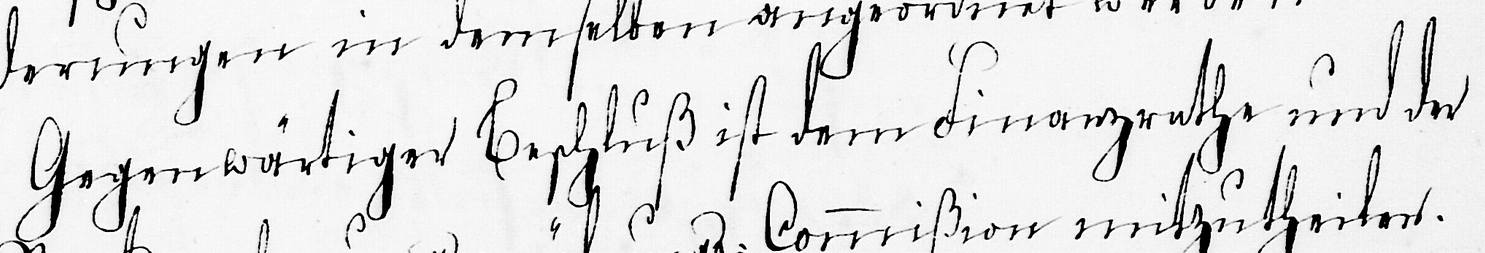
Gegenwärtiger Beschluß ist dem Finanzrathe und der
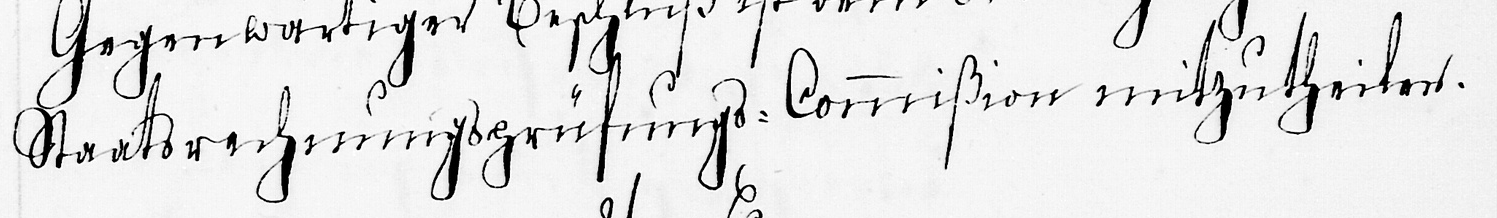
Staatsrechnungsprüfungs-Commißion mitzutheilen.
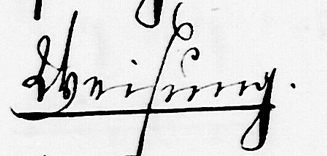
Weisung.
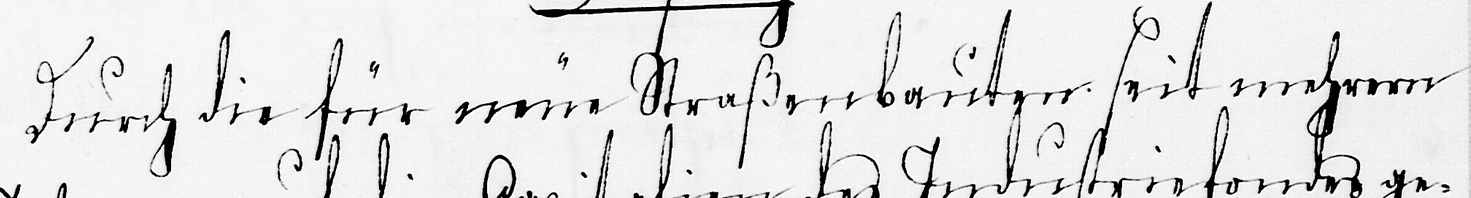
Durch die für neue Straßenbauten seit mehrern
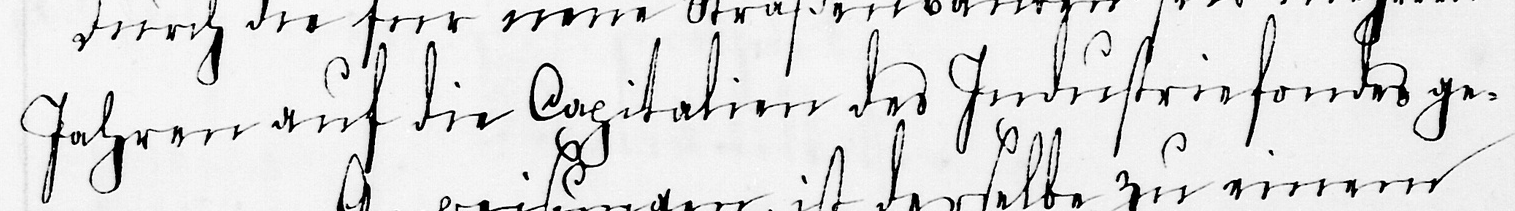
Jahren auf die Capitalien des Industriefondes ge¬
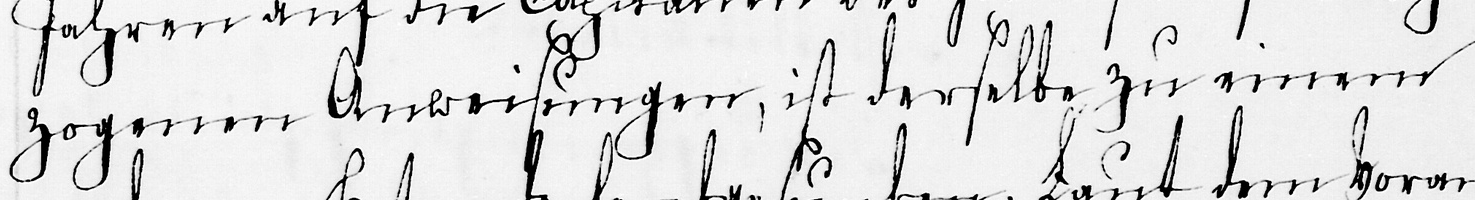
zogenen Anweisungen, ist derselbe zu einem
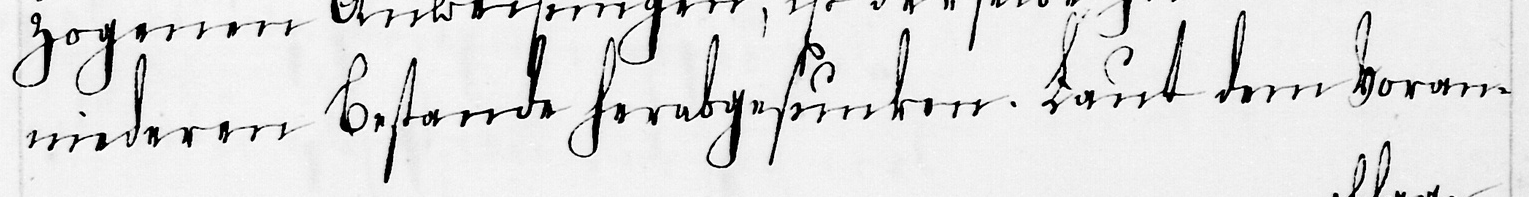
niederen Bestande herabgesunken. Laut dem Voran-
